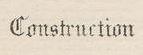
Construction
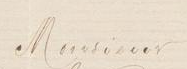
Monsieur
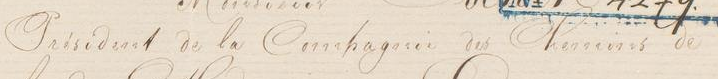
Président de la Compagnie des Chemins de
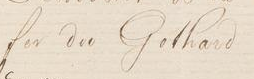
fer du Gothard
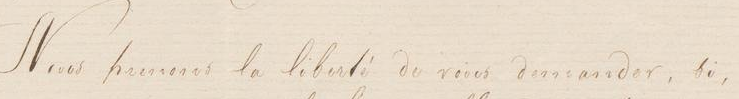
Nous prenons la liberté de vous demander, si,
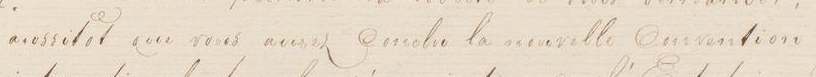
aussitôt que vous aurez conclu la nouvelle Convention
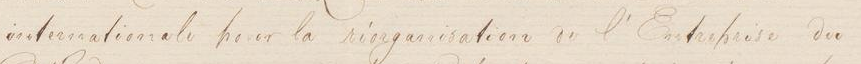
internationale pour la réorganisation de l'Entreprise du
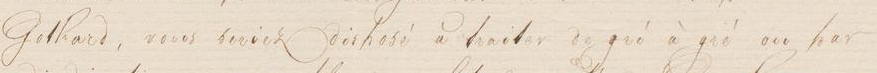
Gothard, vous seriez disposé à traiter de gré à gré ou par
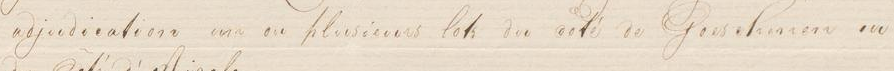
adjudication une ou plusieurs lots du côté de Goeschenen ou
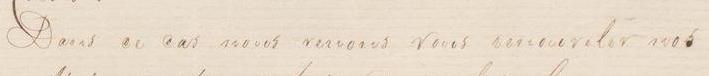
Dans ce cas nous venons vous renouveler nos
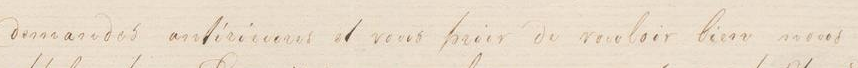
demandes antérieures et vous prier de vouloir bien nous
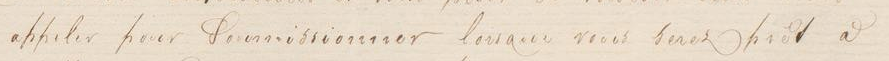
appeler pour Soumissionner lorsque vous serez prêt à
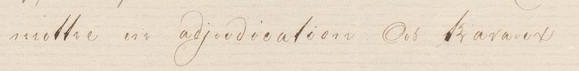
mettre en adjudication ces travaux.
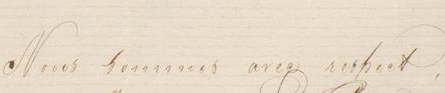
Nous sommes avec respect,
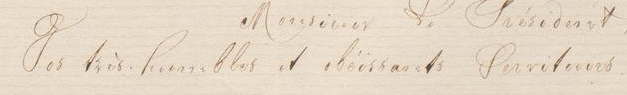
Vos très-humbles et obéissants Serviteurs
